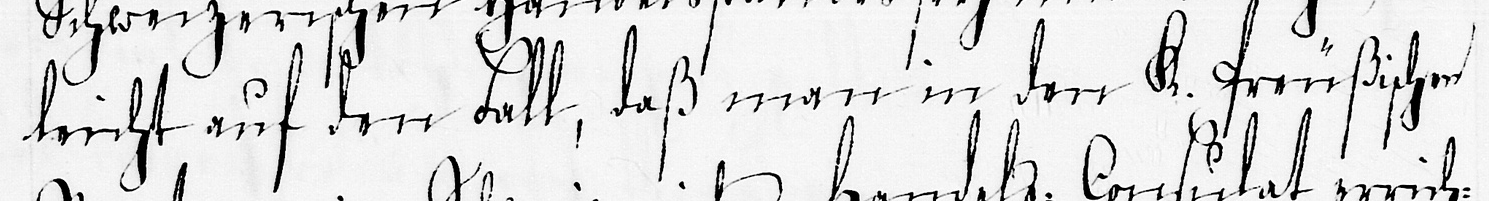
leicht auf den Fall, daß man in den K. Preußischen
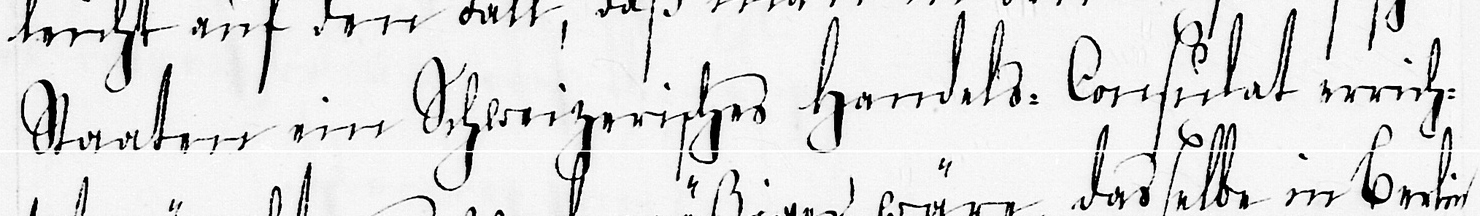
Staaten ein Schweizerisches Handels-Consulat errich¬
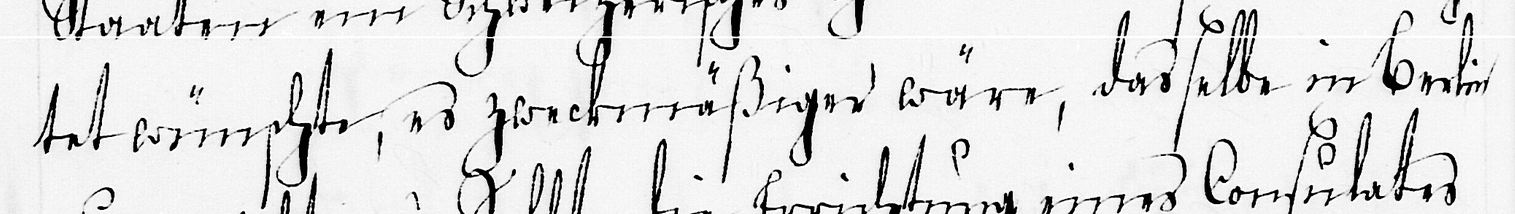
tet wünschte, es zweckmäßiger wäre, dasselbe in Berlin
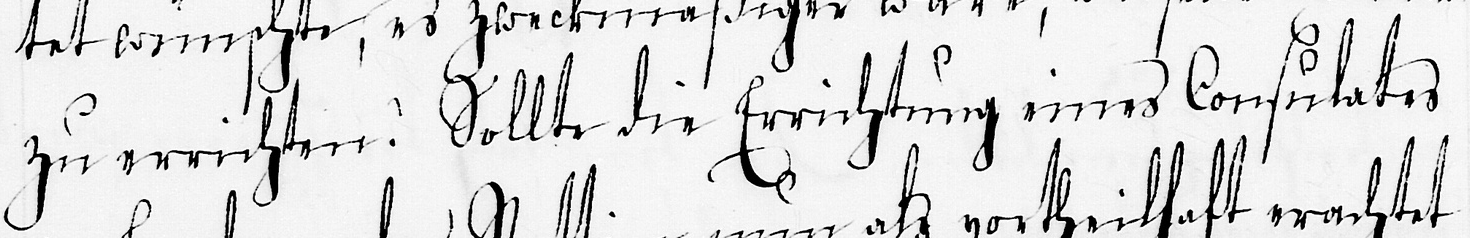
zu errichten? Sollte die Errichtung eines Consulates
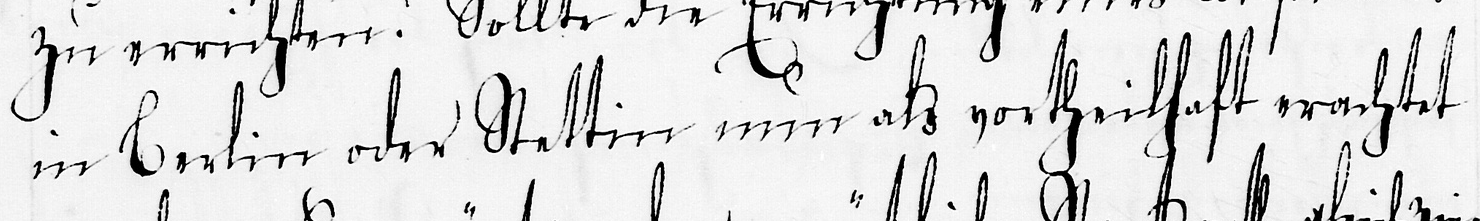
in Berlin oder Stettin nun als vortheilhaft erachtet
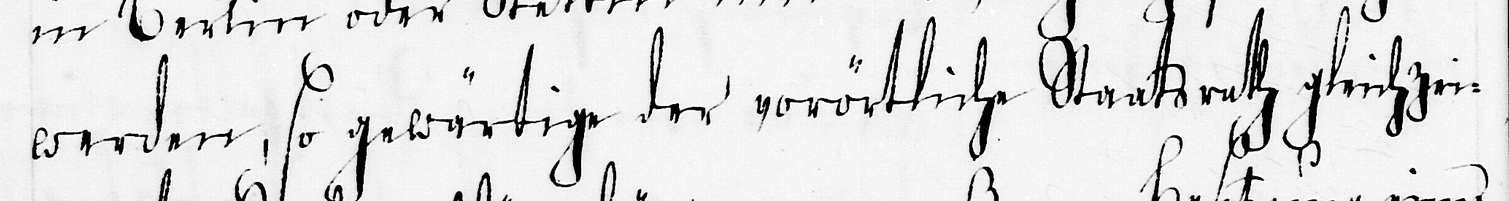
werden, so gewärtige der vorörtliche Staatsrath gleichze¬
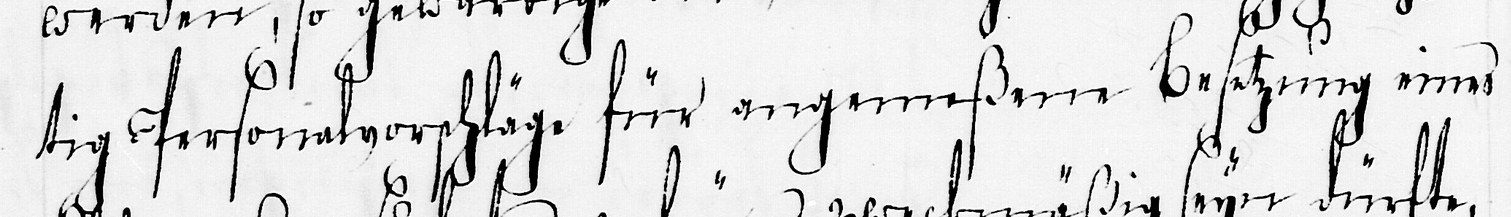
itig Personalvorschläge für angemeßene Besetzung eines
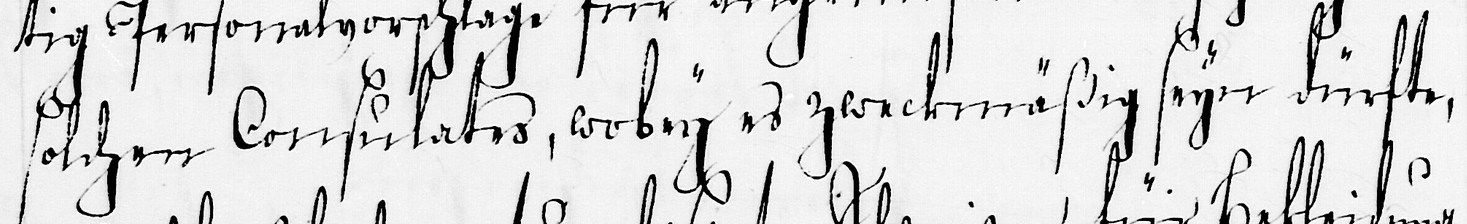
solchen Consulates, wobey es zweckmäßig seyn dürfte,
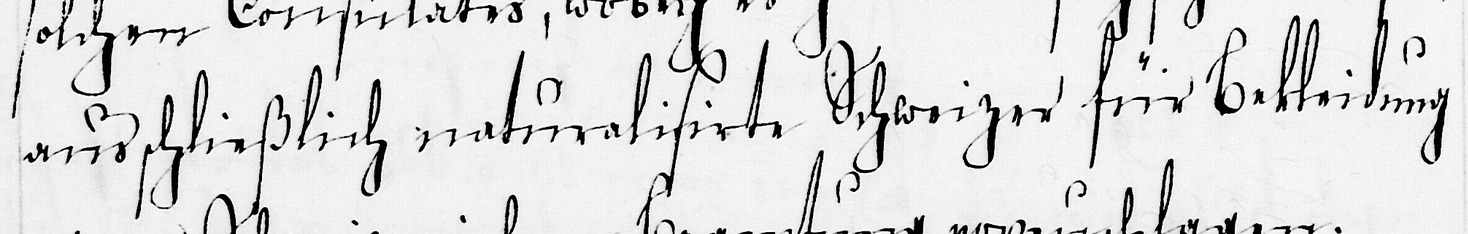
ausschließlich naturalisirte Schweizer für Bekleidung
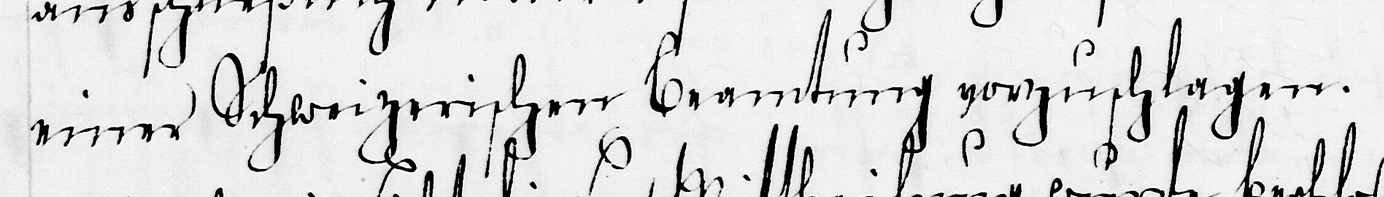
einer Schweizerischen Beamtung vorzuschlagen.
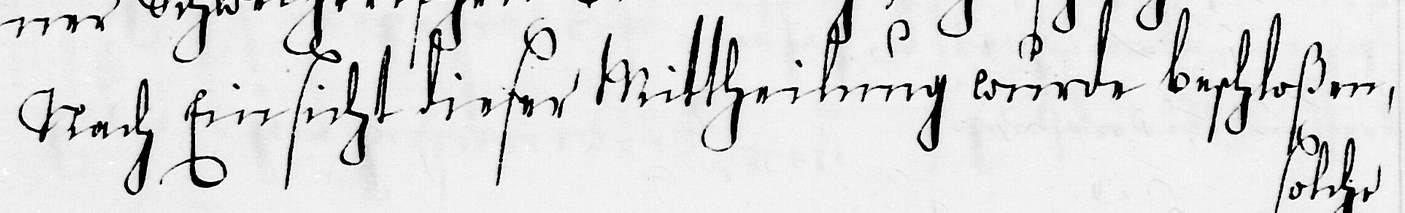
Nach Einsicht dieser Mittheilung wurde beschloßen,
